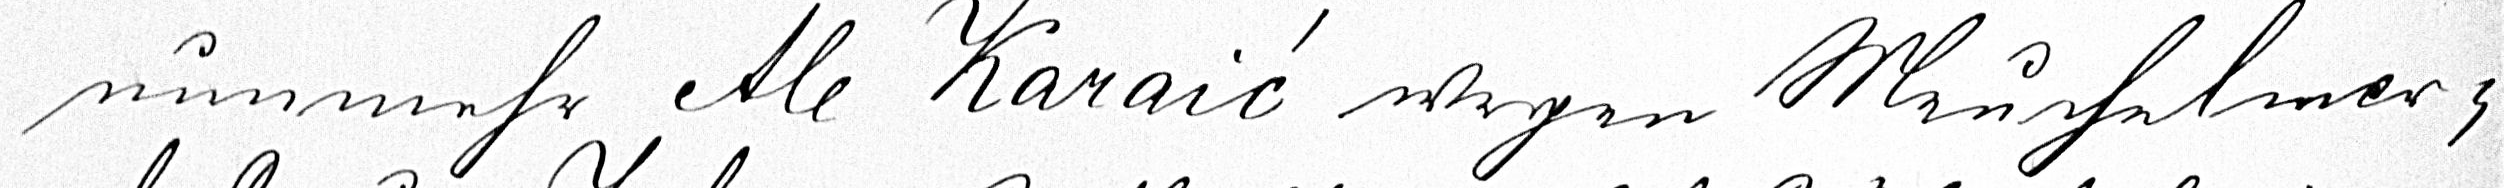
nunmehr Ale Karaić wegen Meuchelmor
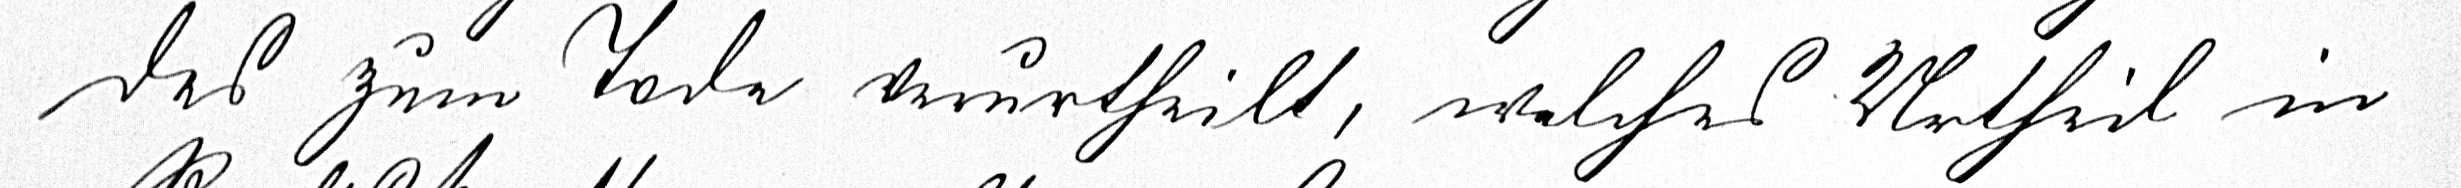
des zum Tode verurtheilt, welches Urtheil in
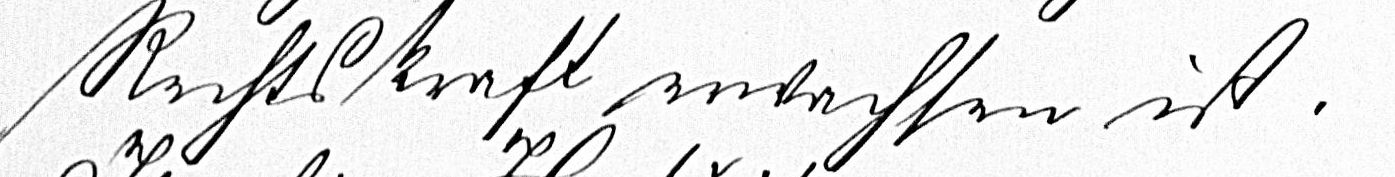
Rechtskraft erwachsen ist.
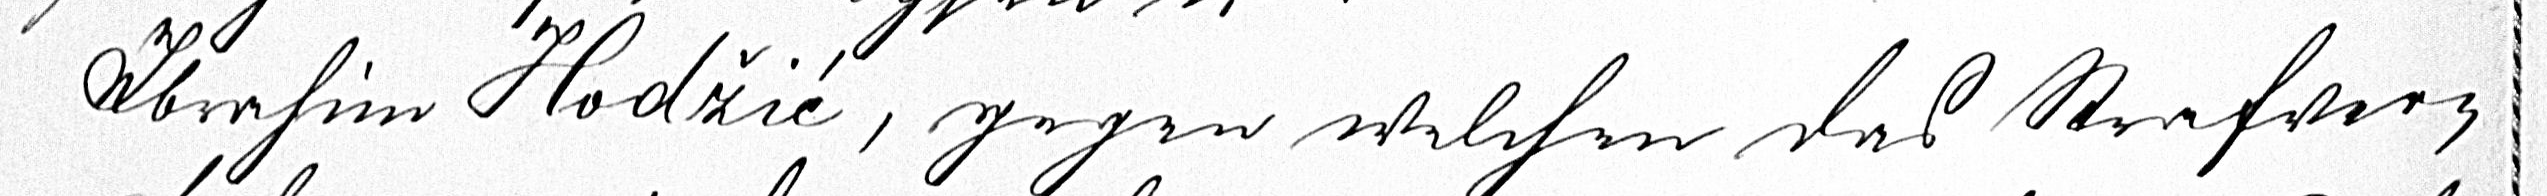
Ibrahim Hodzić, gegen welchen das Strafver¬
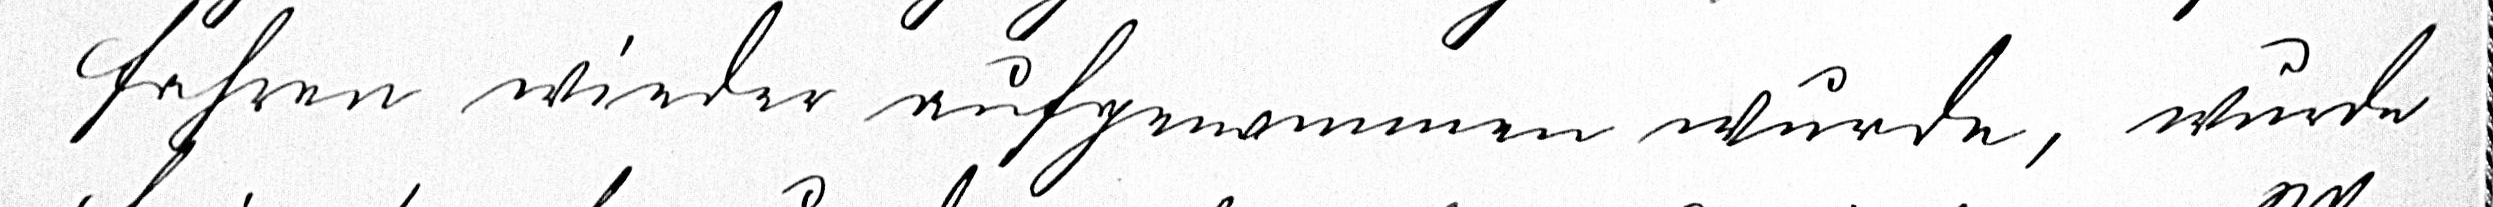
fahren wieder aufgenommen wurde,
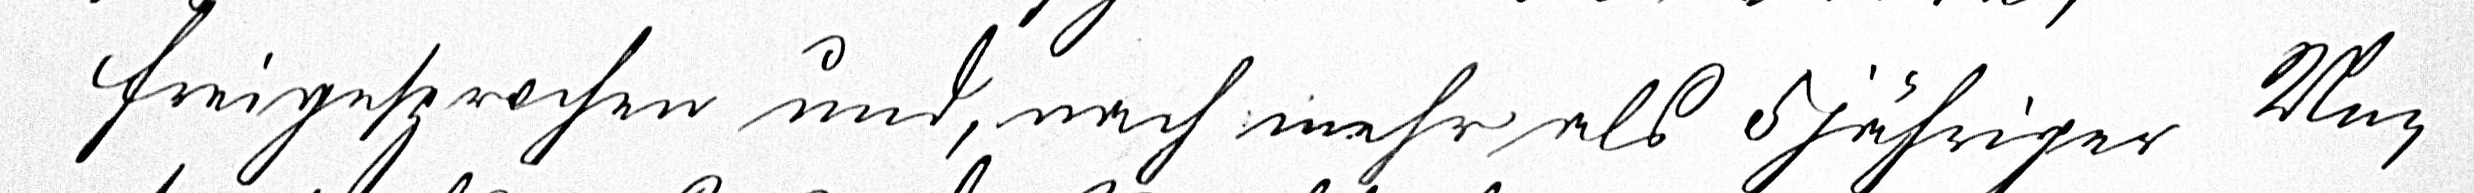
wurde freigesprochen und, nach mehr als 5 jähriger Un¬
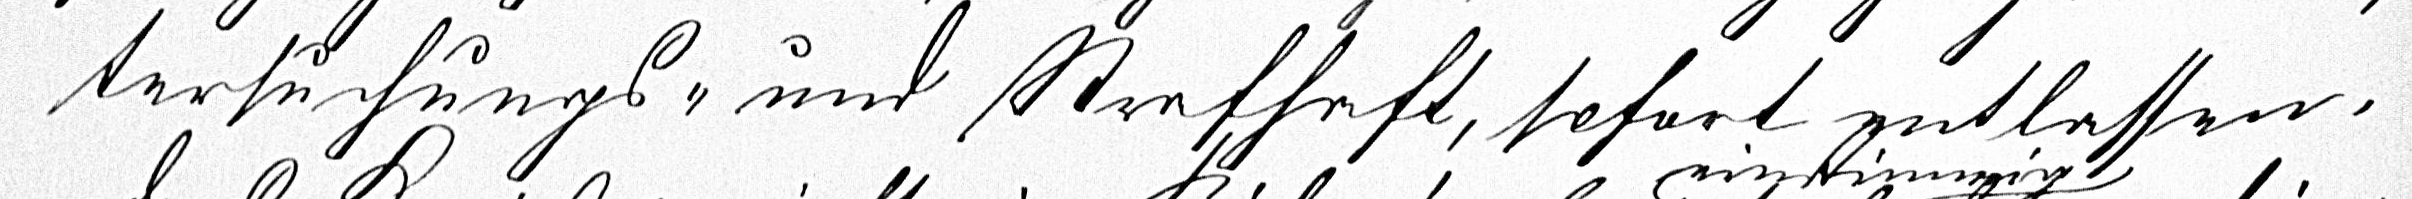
tersuchung und Strafhaft, sefort entlassen
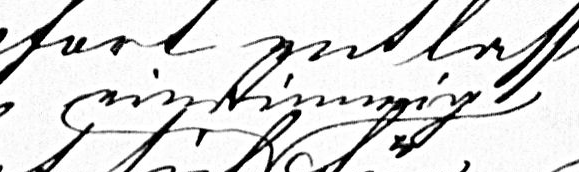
einstimmig
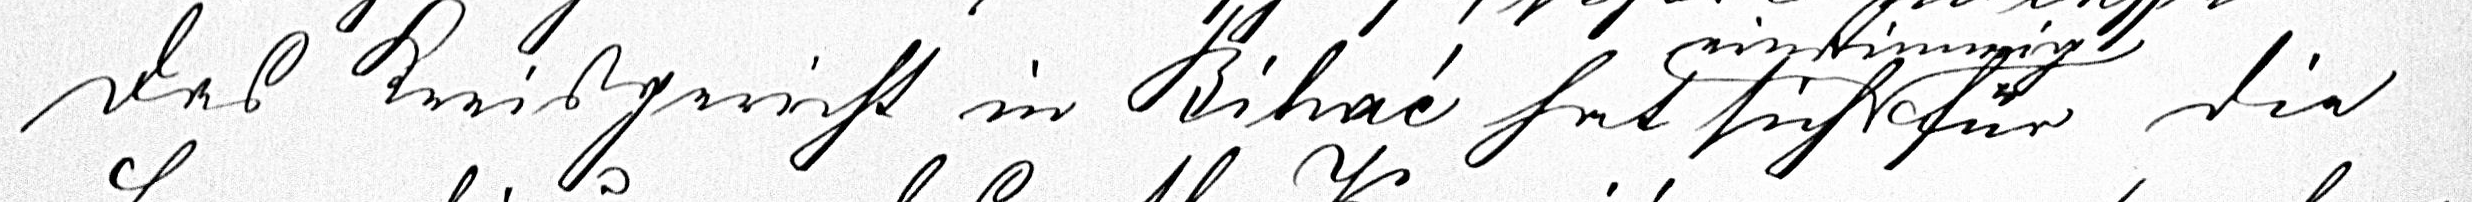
das Kreisgericht in Bihać hat sich für die
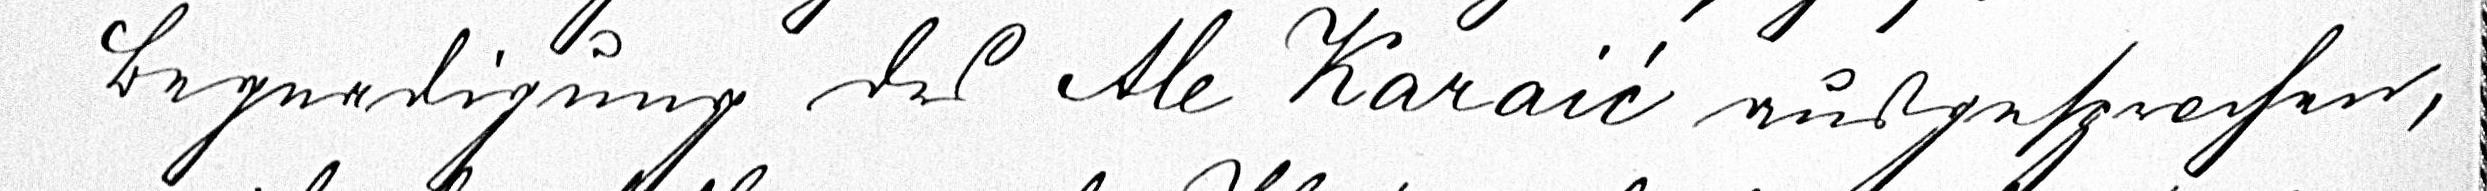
Begnadigung des Ale Karaić ausgesprochen,
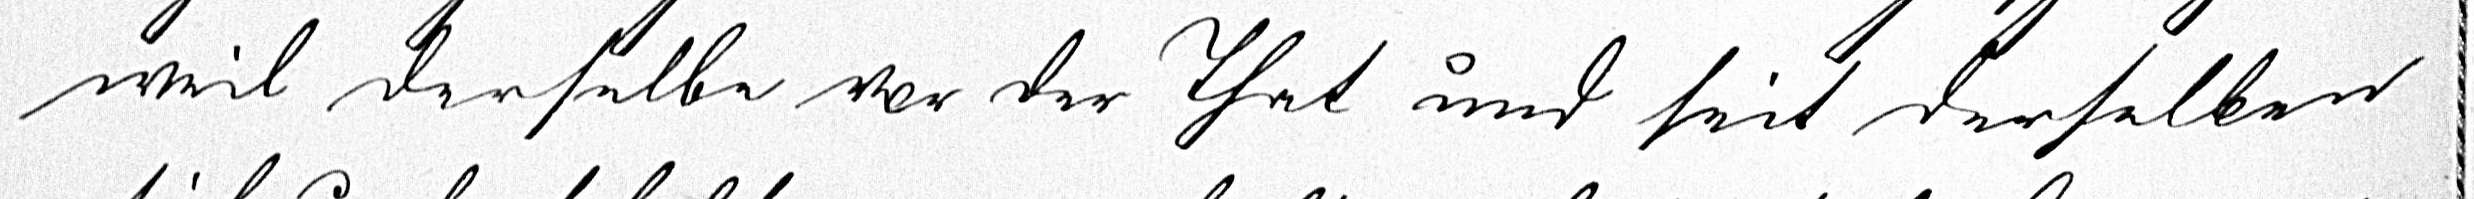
weil derselbe vor der That und seit derselben
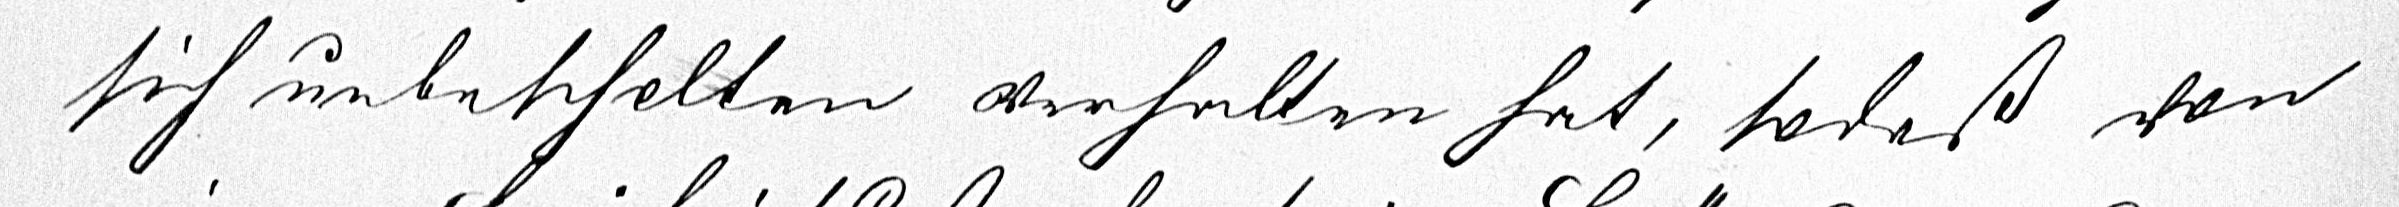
sich unbeschelten verhalten hat, sodes von
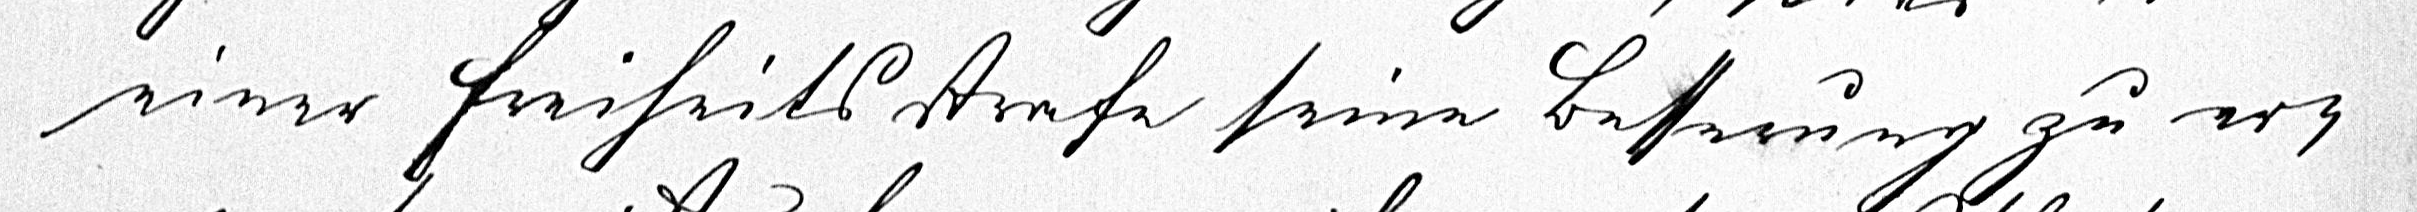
einer Freiheitsstrafe seine Besserung zu er¬
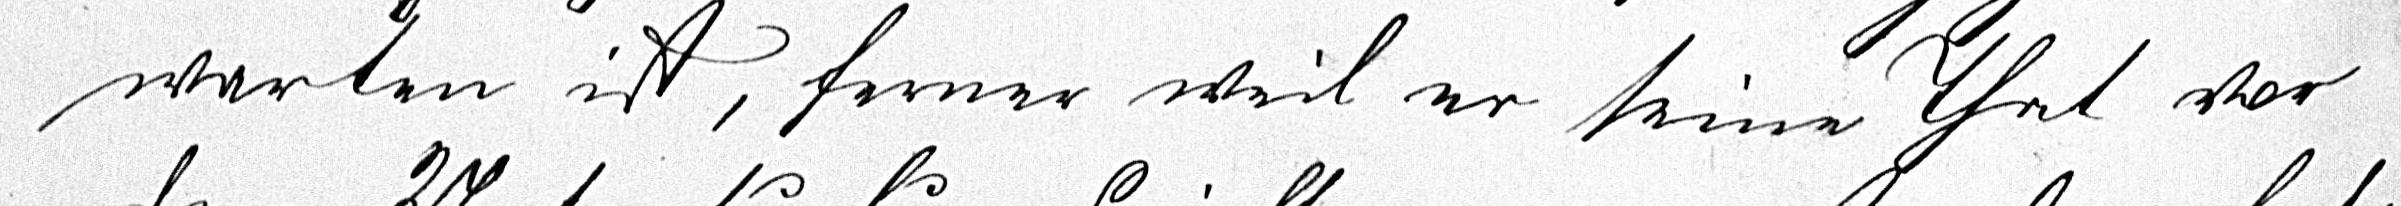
warten ist, ferner weil er seine That vor
